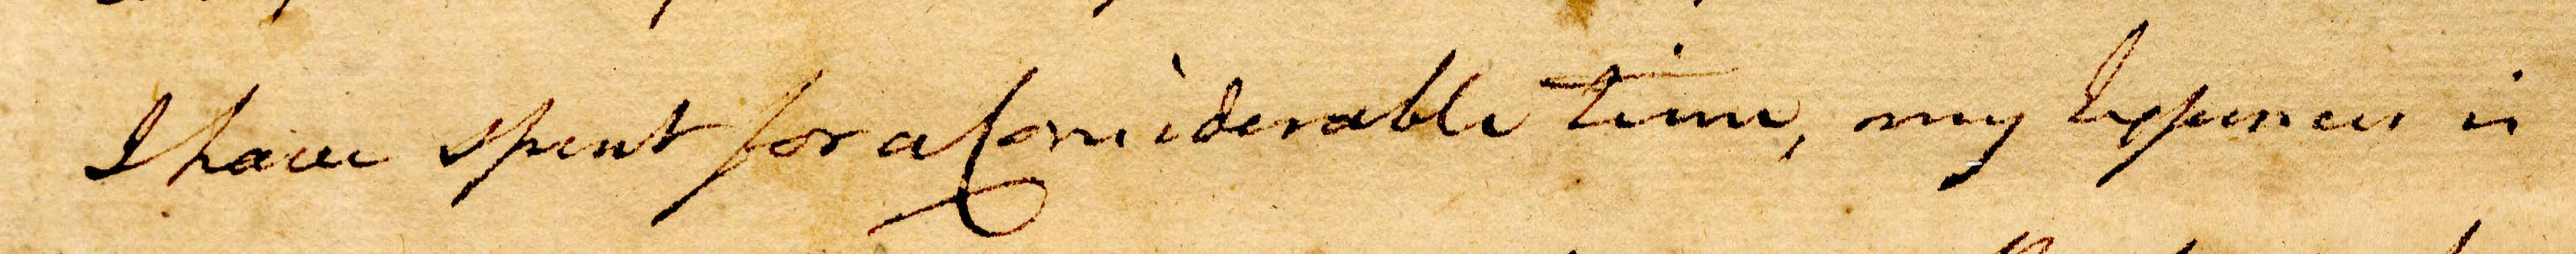I have spent for a Considerable time, my Expences is
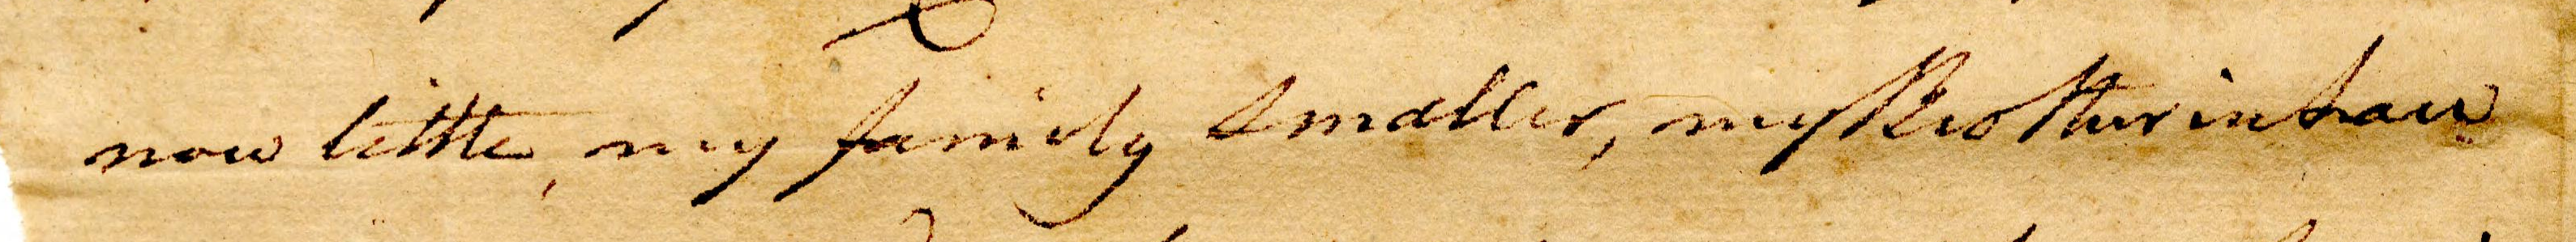now little, my family Smaller, my brother in Law
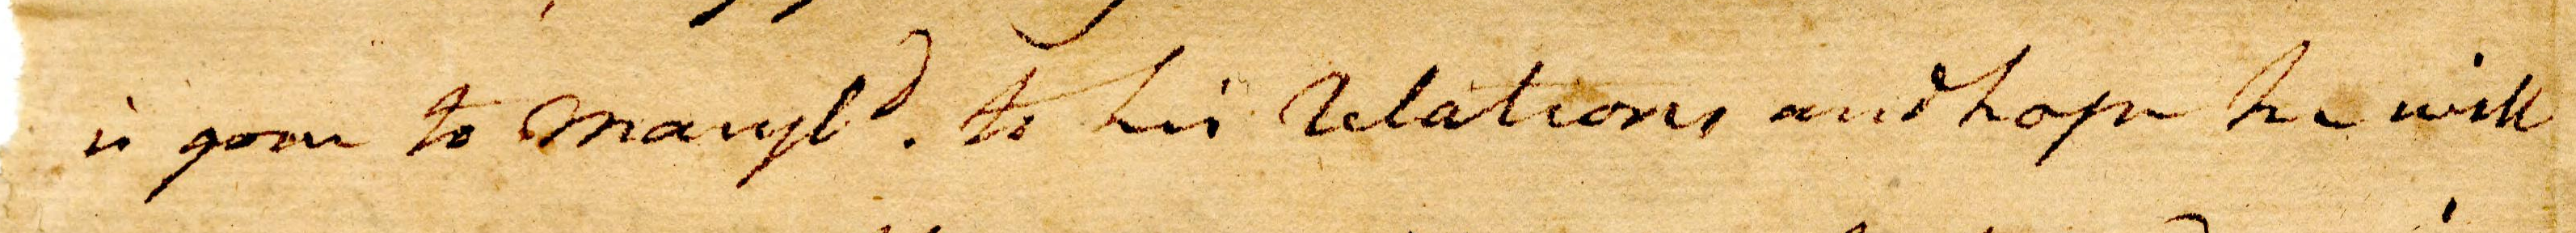is gone to Maryl^d to his relations and hope he will
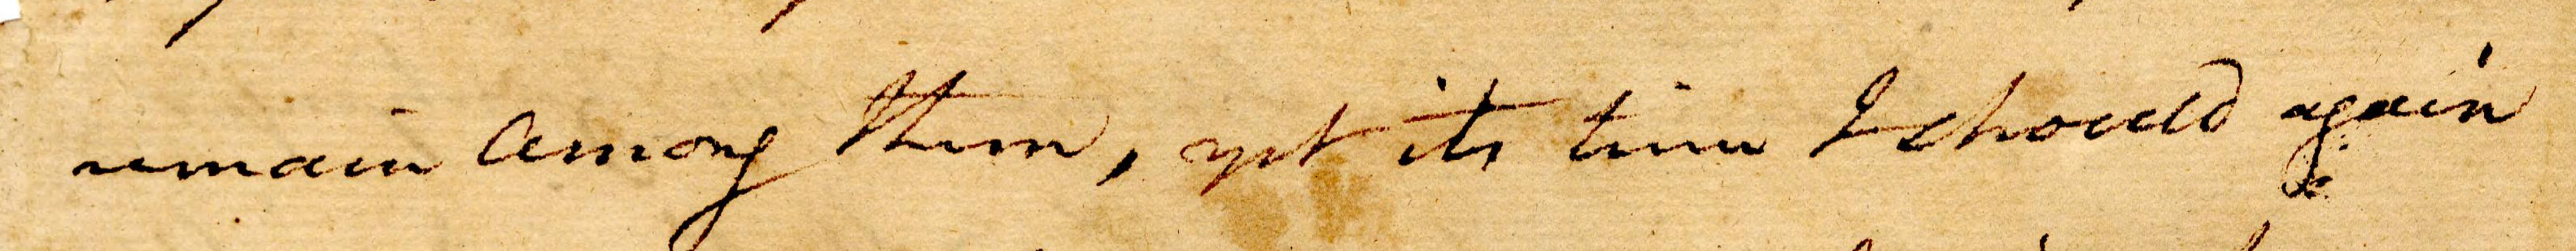remain Among them, yet its time I should again
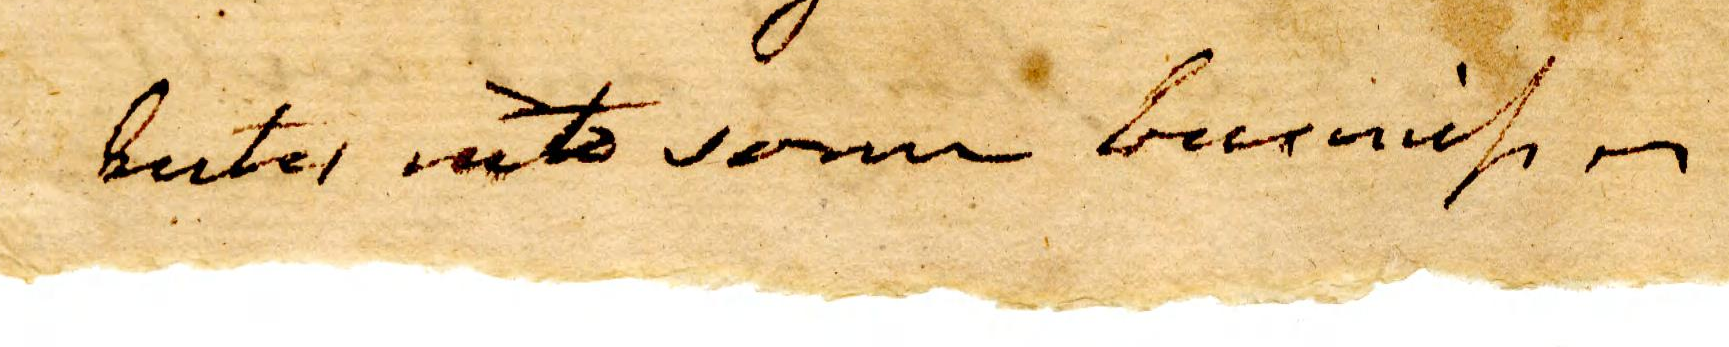Enter into some business-
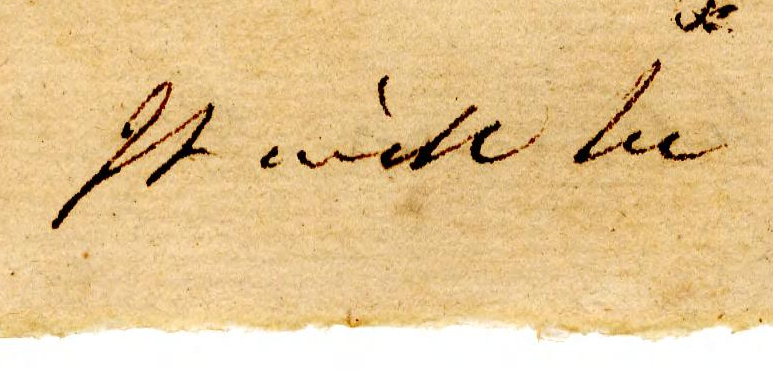It will be
